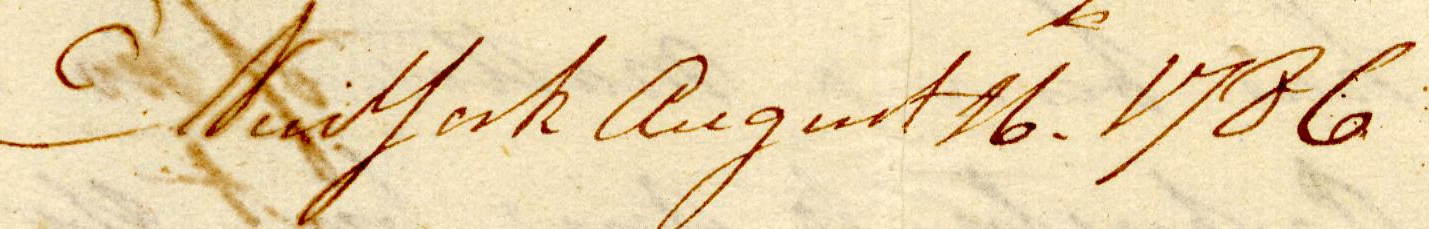New York August 16^th. 1786
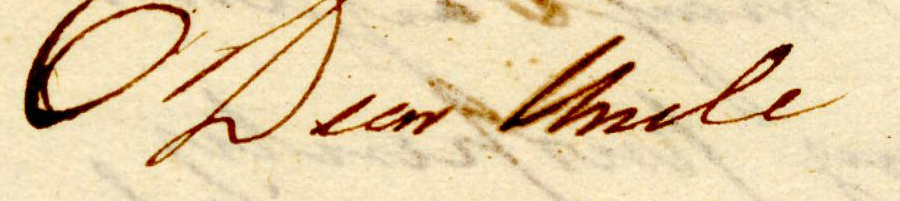Dear Uncle
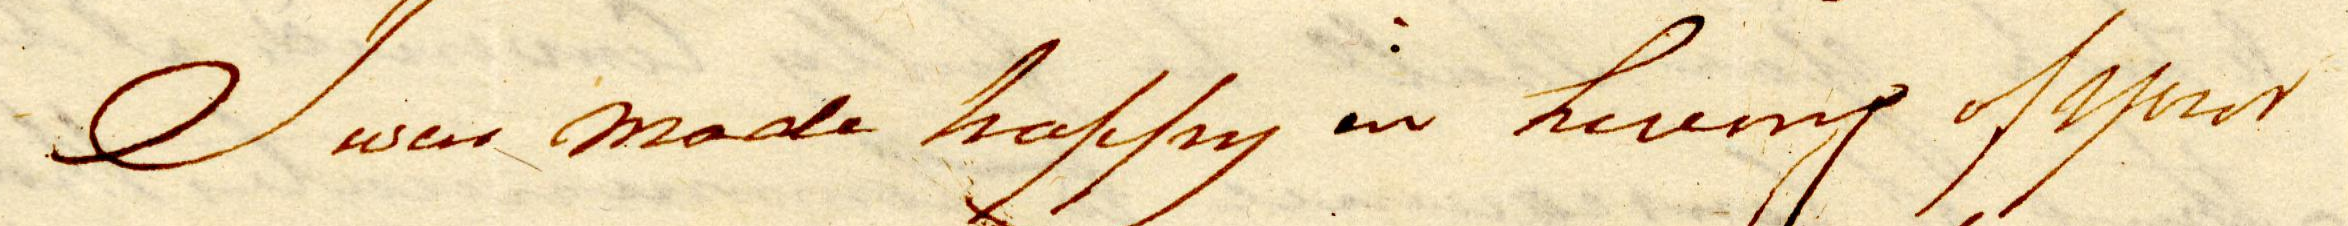I was made happy in hearing of your
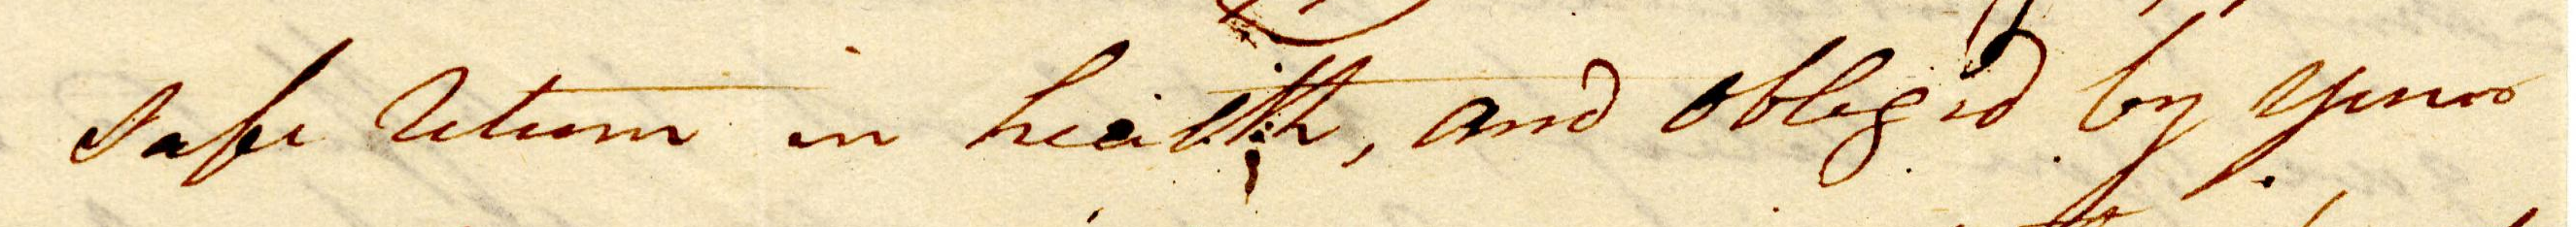Safe return in health, and obliged by your
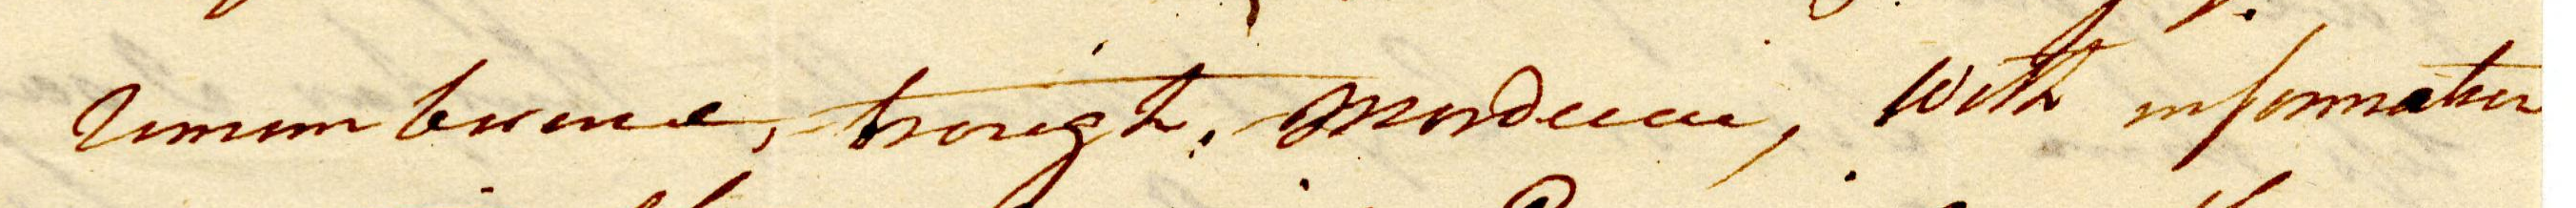remembrance, trough Mordecai, With information
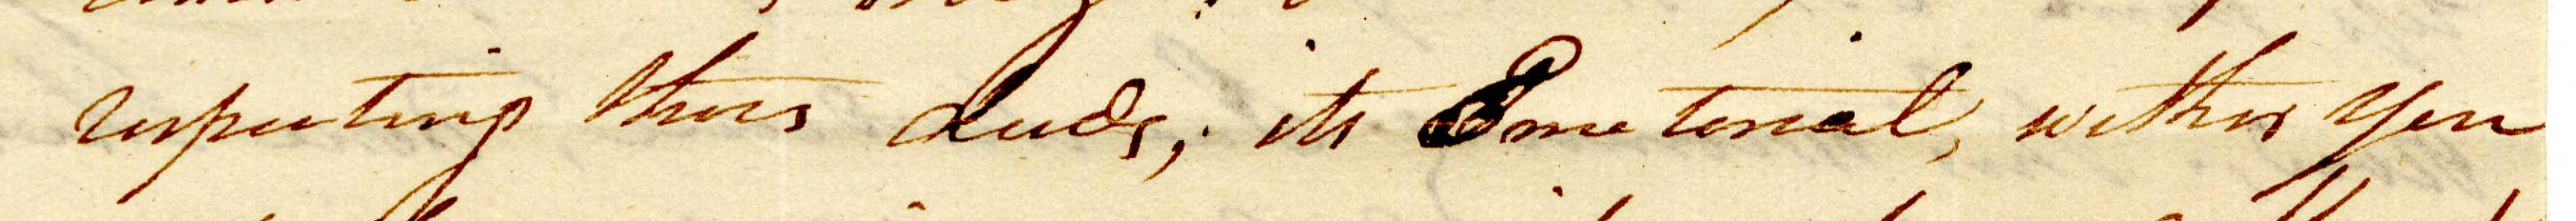respecting thers deeds; its Some trial, wether you
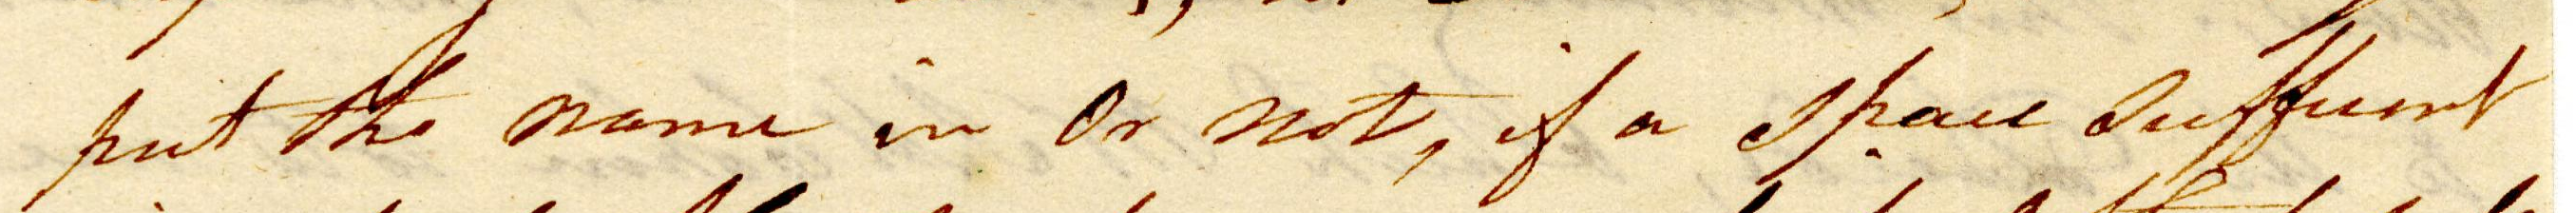put the name in or not, if a space sufficient
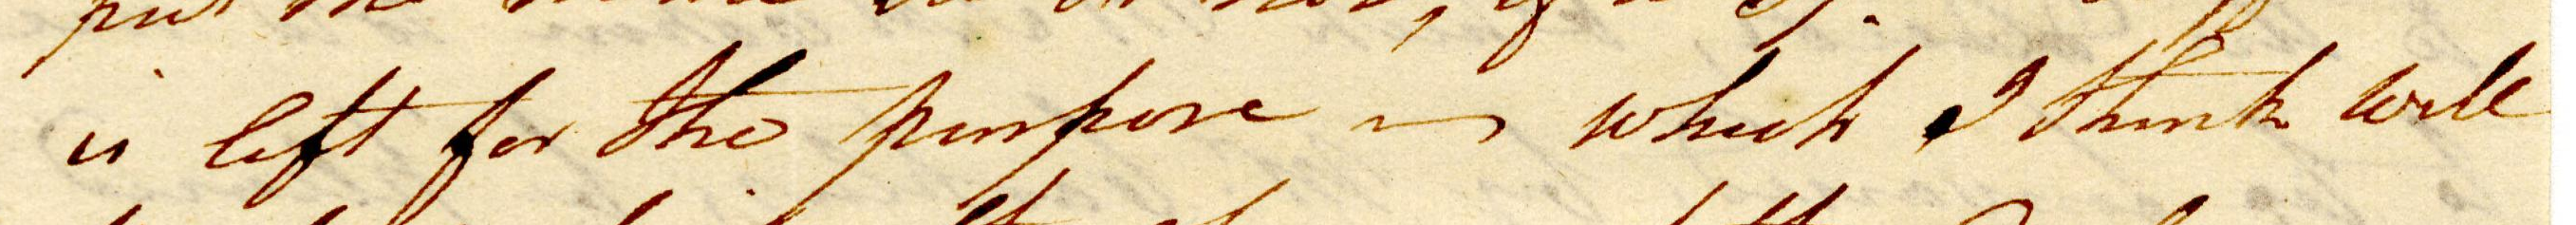is left for the purpose- which I think will
